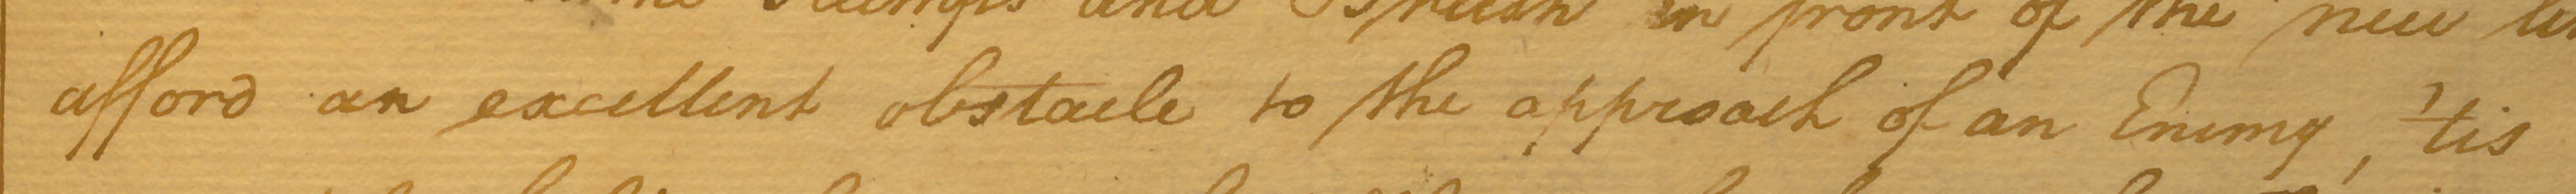afford an excellent obstacle to the approach of an Enemy, 'tis
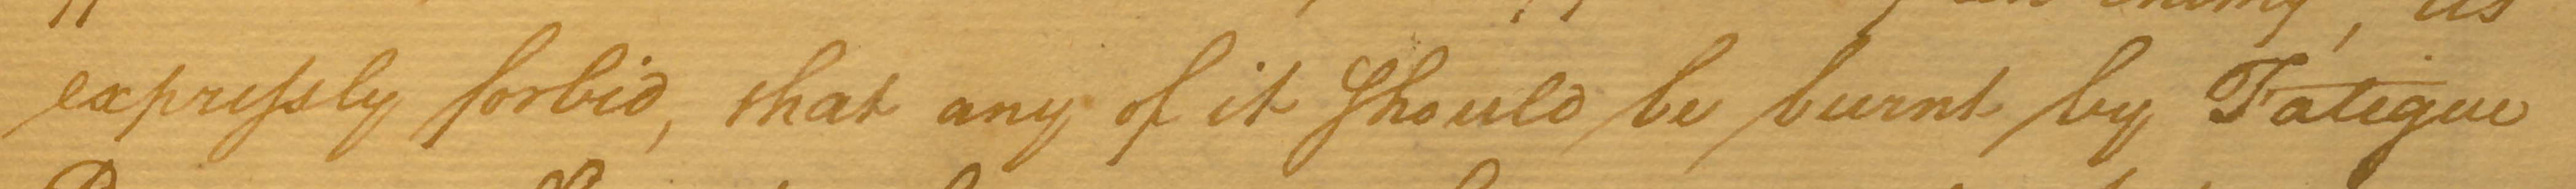expressly forbid, that any of it should be burnt by Fatigue
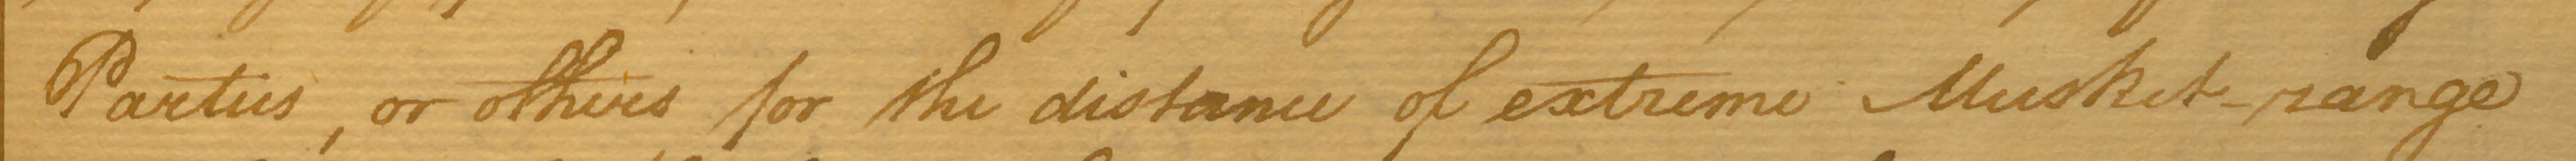Parties, or others for the distance of extreme Musket-range
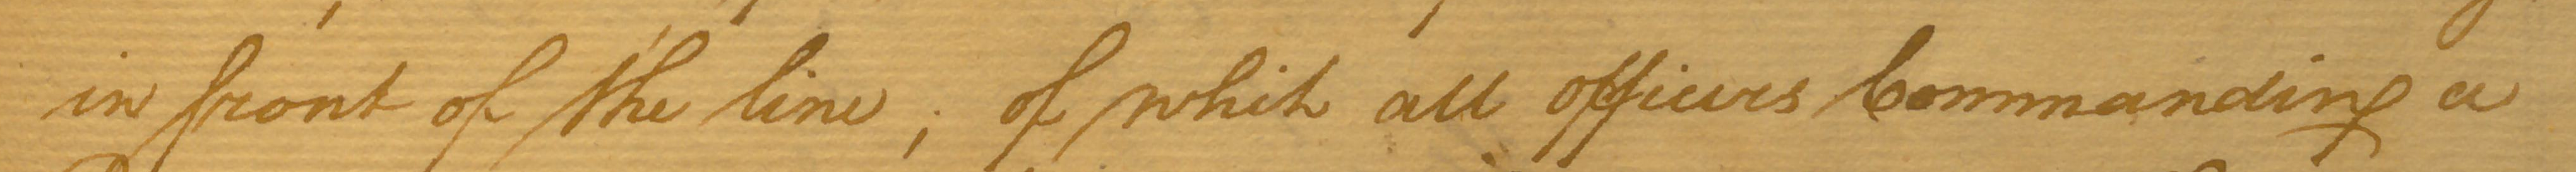in front of the line; of which all officers Commanding a
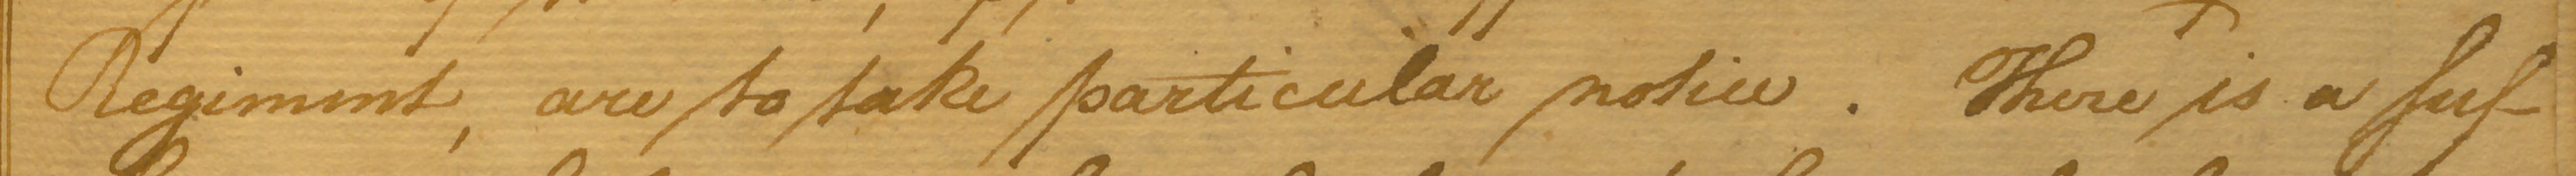Regiment, are to take particular notice. There is a suf-
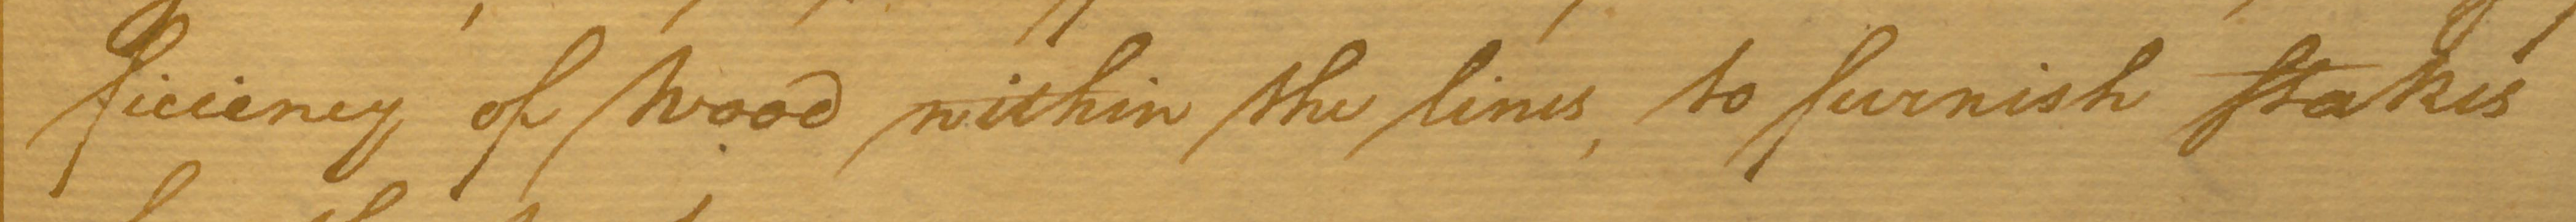ficiency of wood within the lines, to furnish stakes
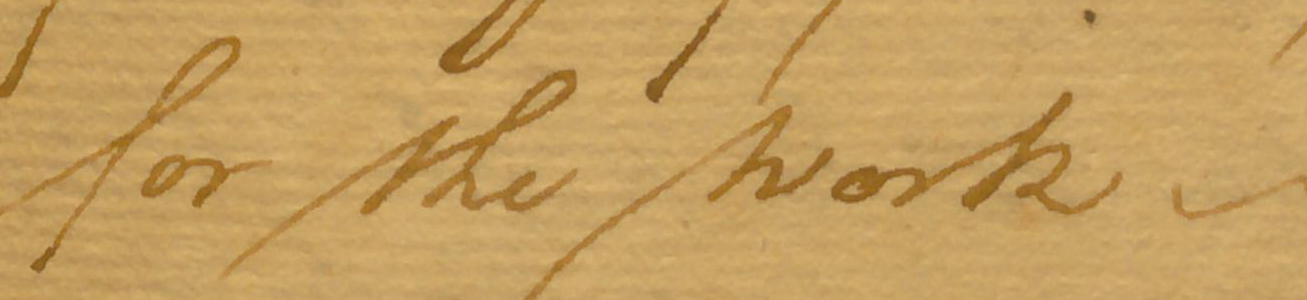for the work-
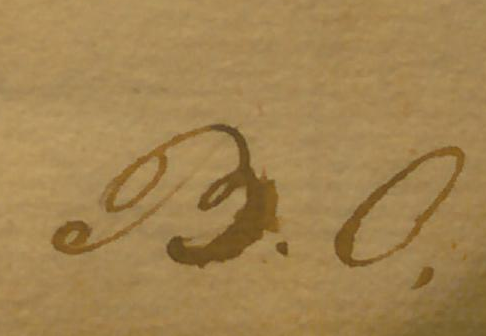B. O.
